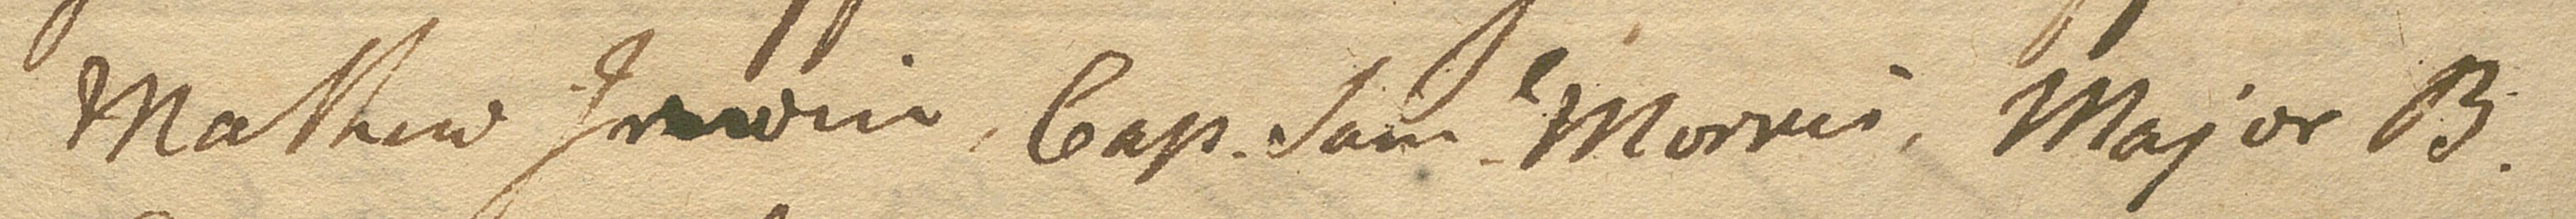Mathew Irwin, Cap. Sam^l. Morris, Major B.
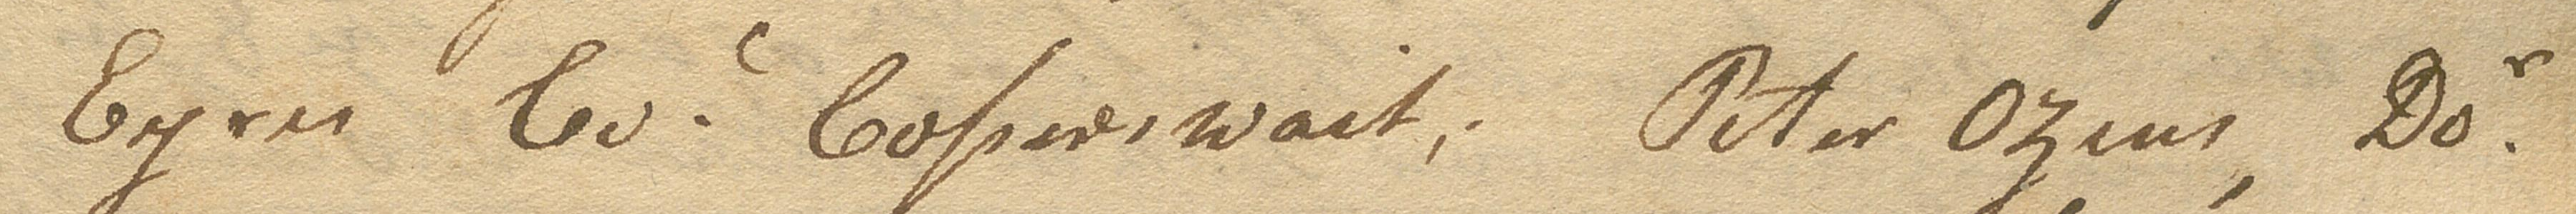Eyres Co^l. Coperswait, Peter Ozens Do^r.
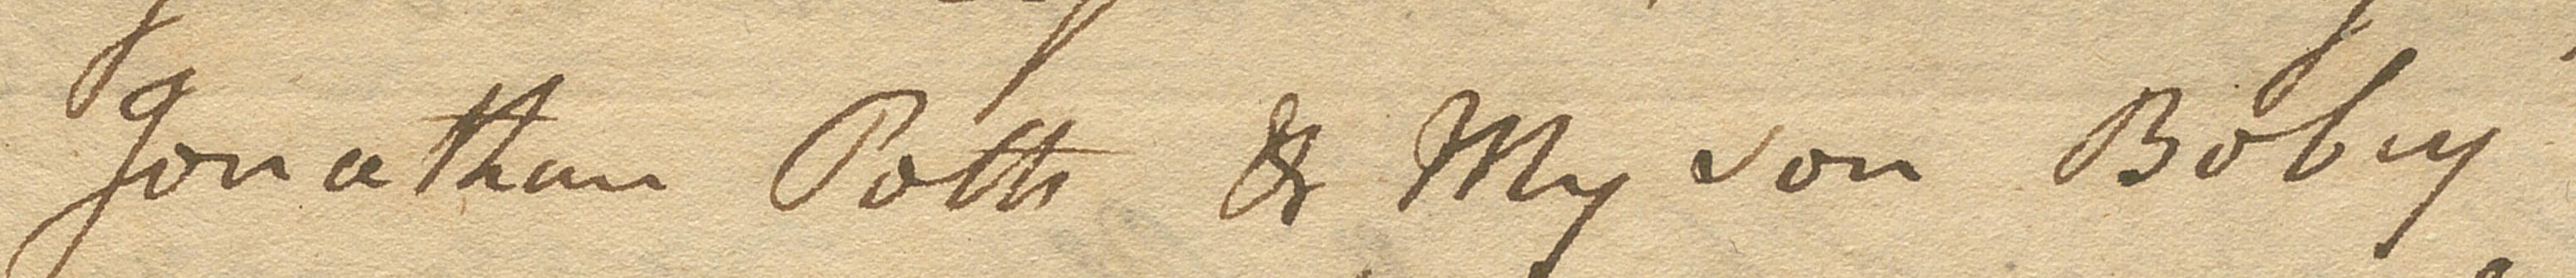Jonathan Potts & My son Bobey
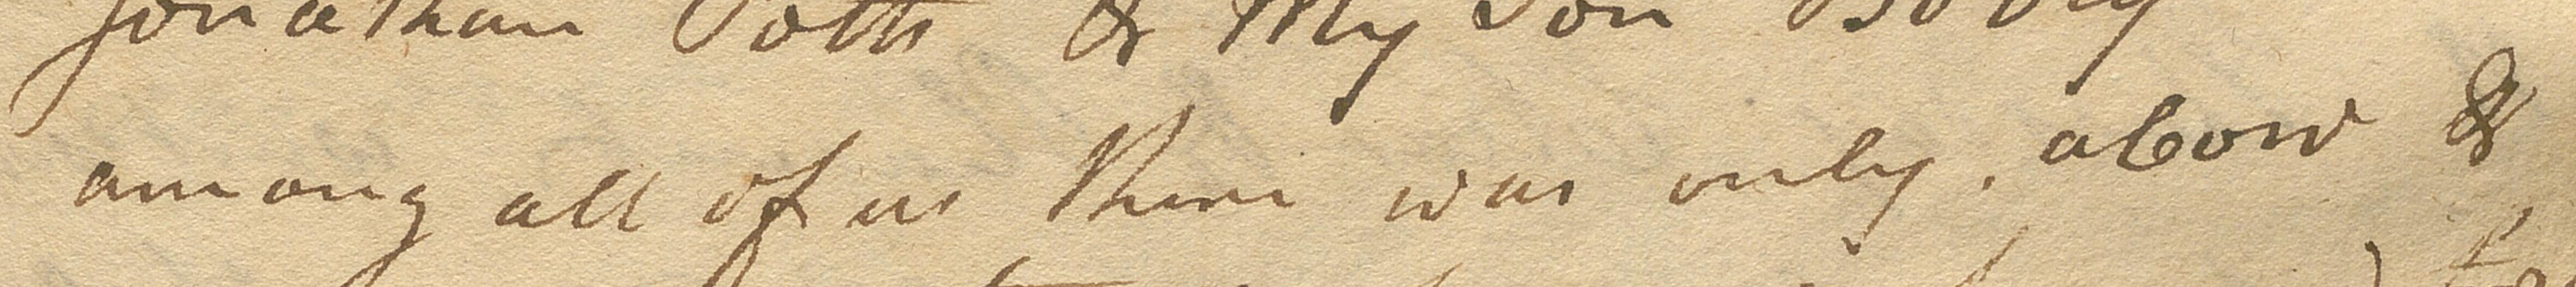among all of us there was only a Cow &
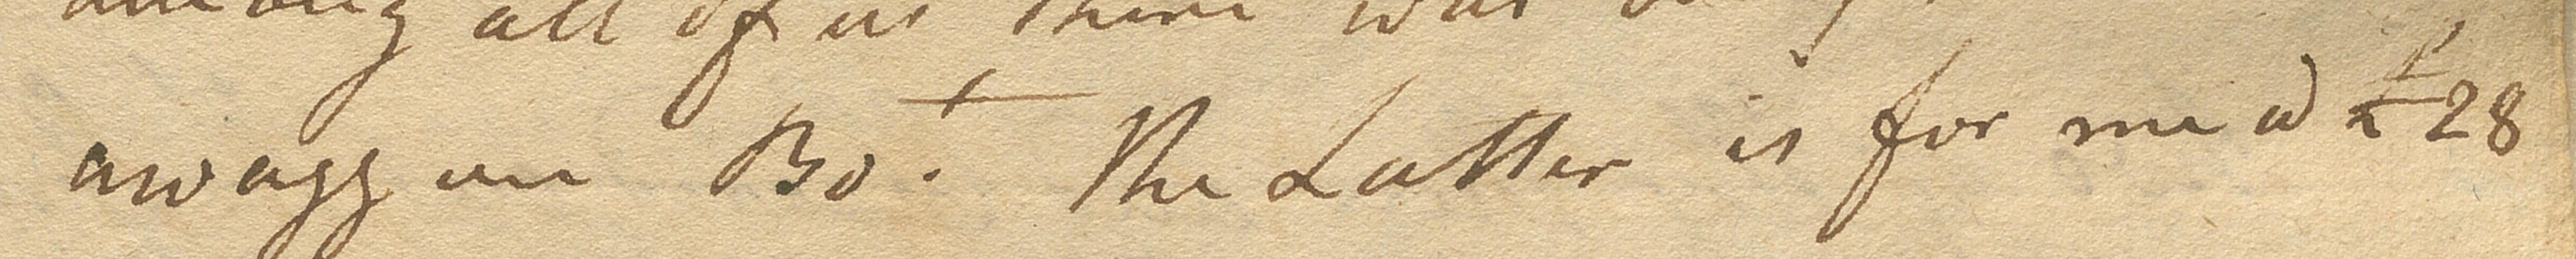a waggon Bo^t. the Latter is for me @ £28
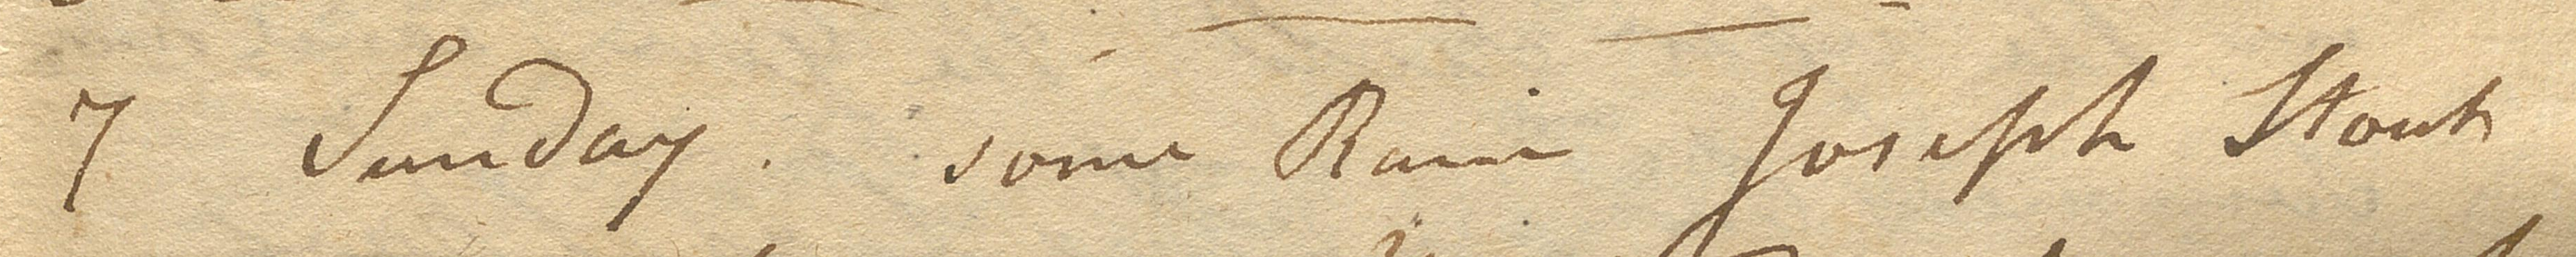7 Sunday. some Rain Joseph Stout
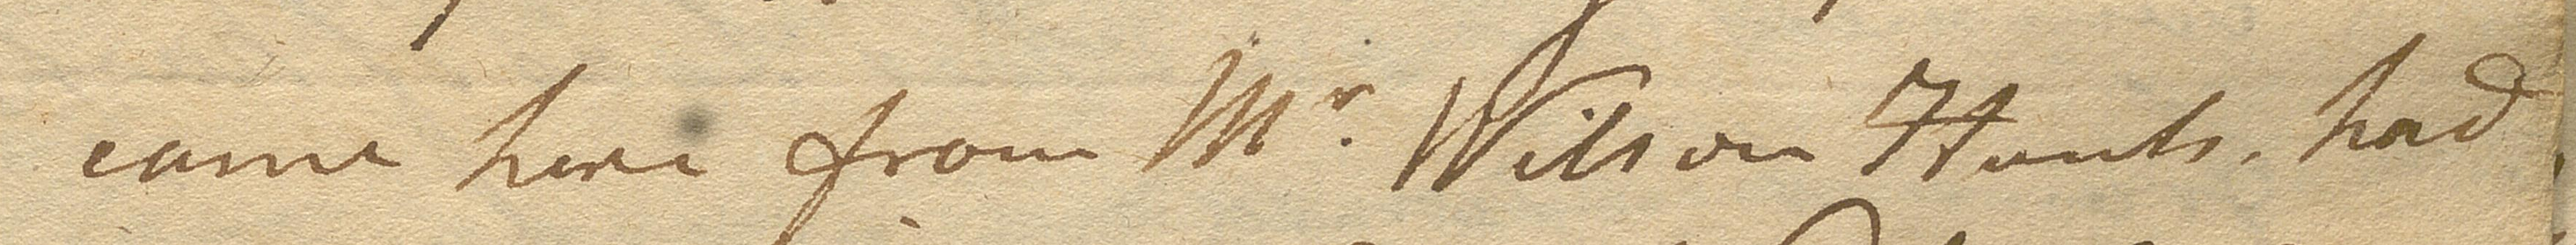came here from M^r. Wilson Hunts had
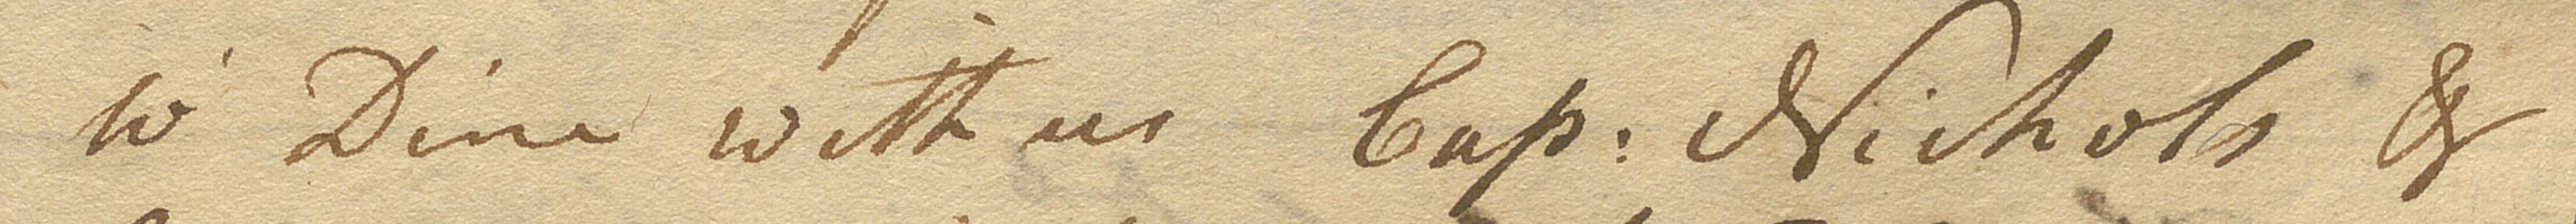to Dine with us Cap^t. Nichots &
